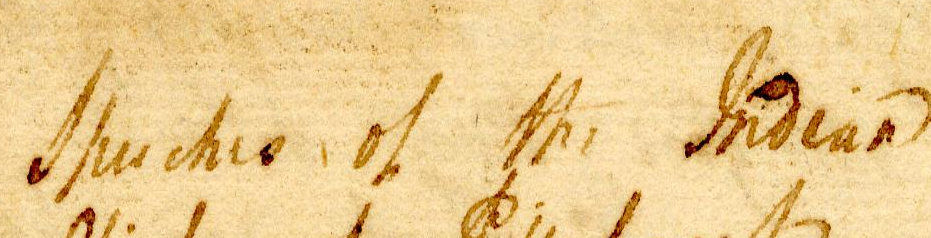Speeches of the Indian
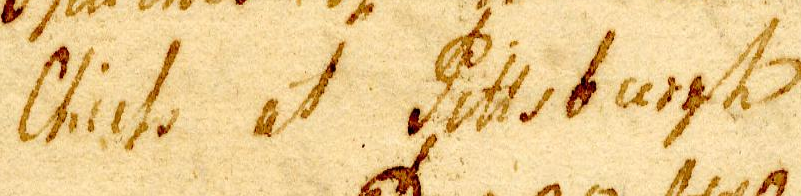Chiefs at Pittsburgh
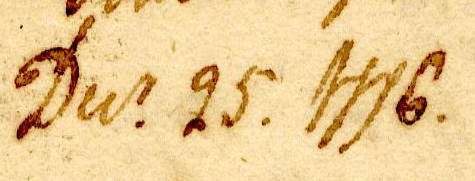Dec^r. 25. 1776.
